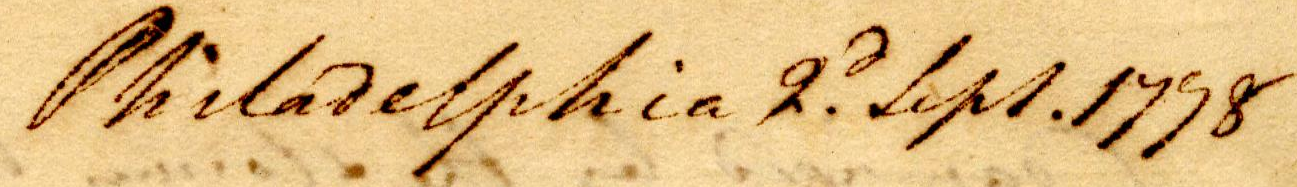Philadelphia 2^d. Sept. 1778
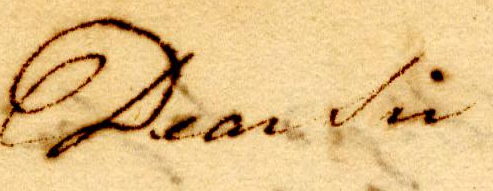Dear Sir
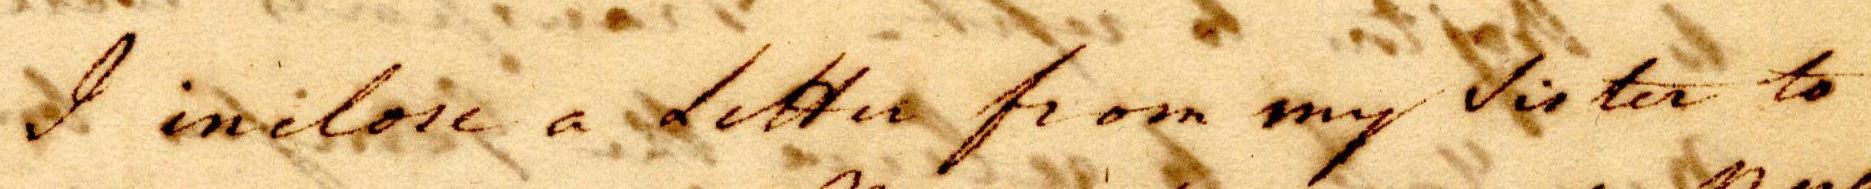I inclose a Letter from my Sister to
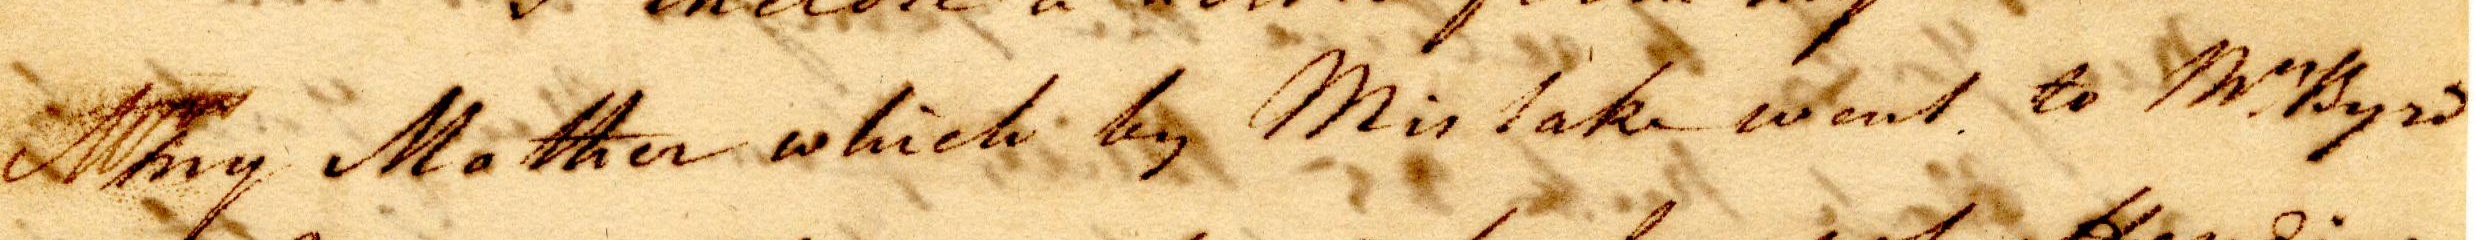my Mother which by Mistake went to M^r. Byrd
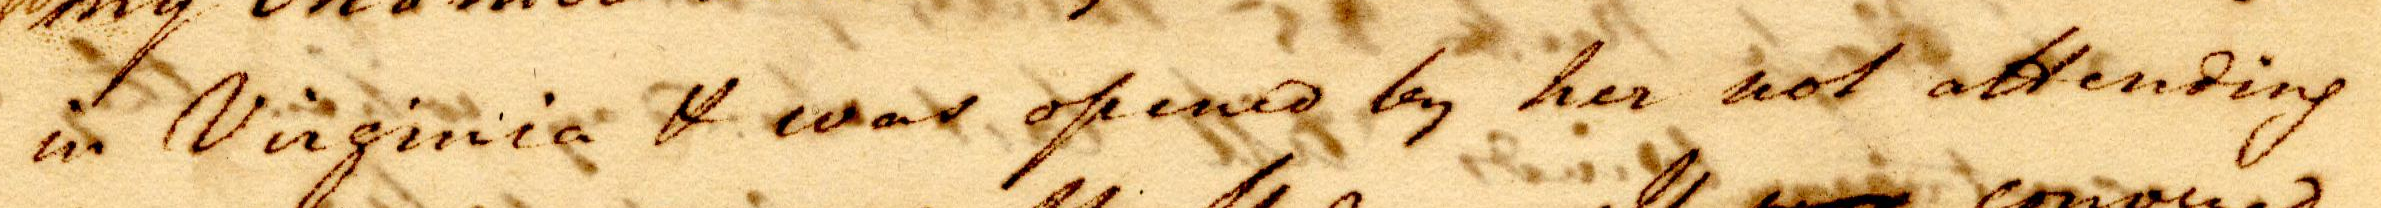in Virginia & was opened by her not attending
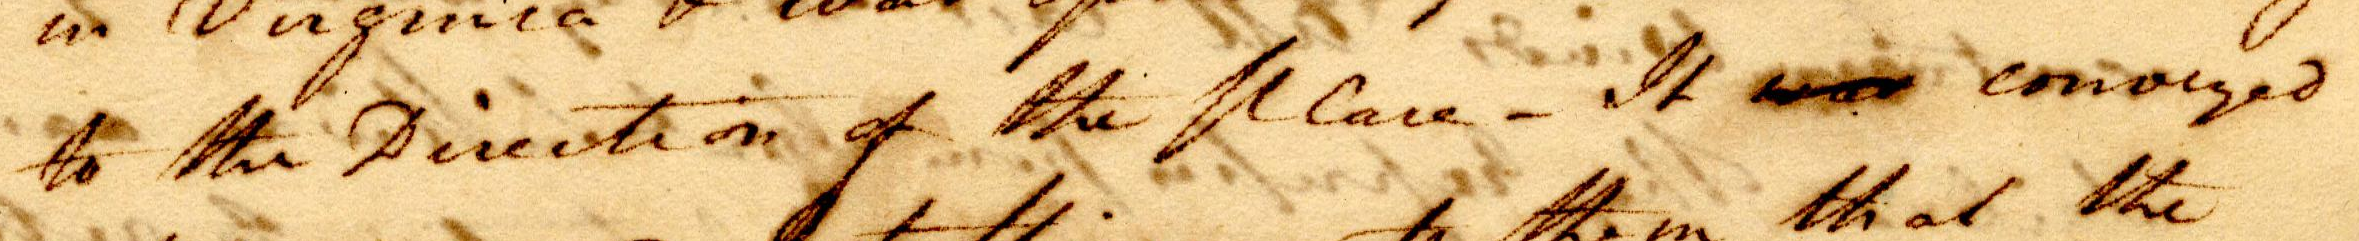to the Direction of the P Care. It was conveyed
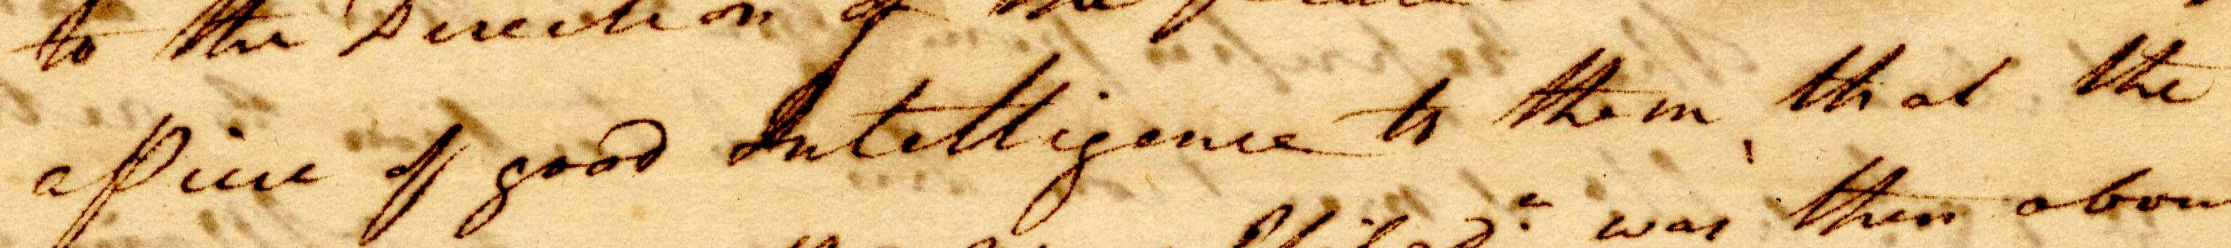a Piece of good Intelligence to them that the
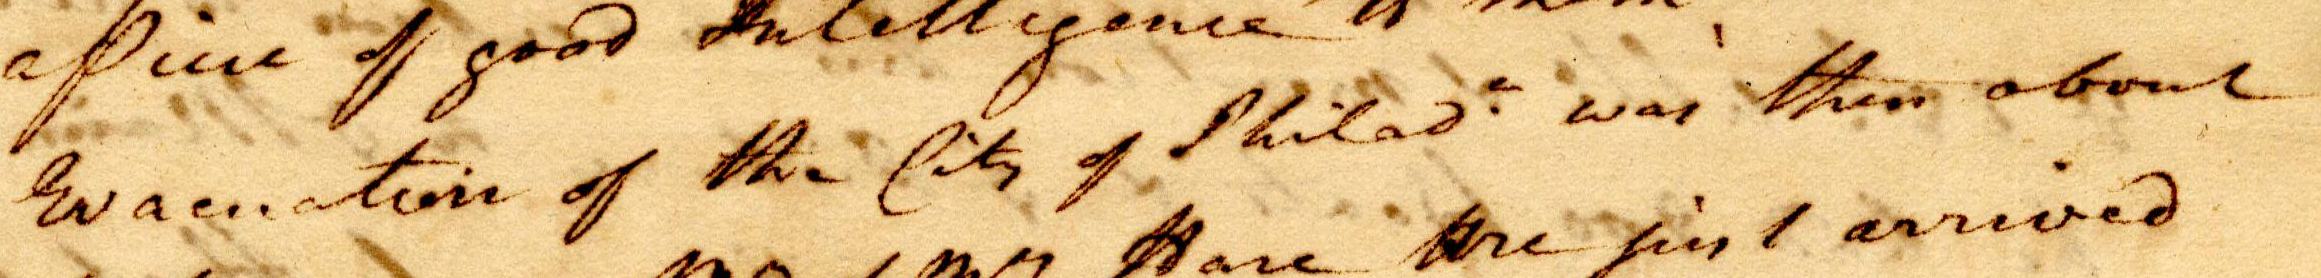Evacuation of the City of Philad^a. was then about
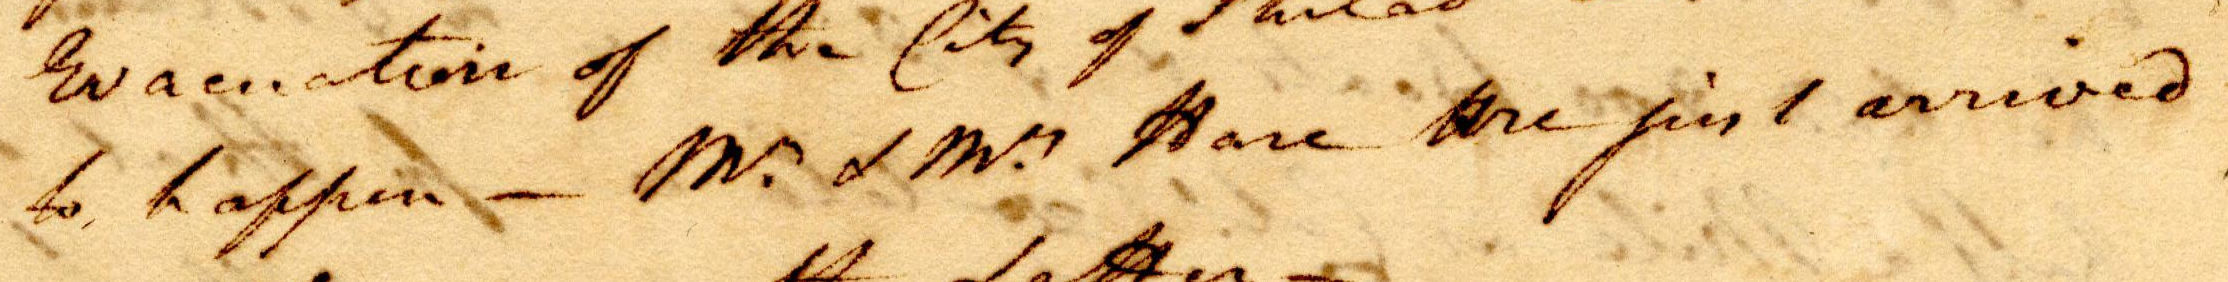to happen. M^r. & M^rs. Hare are just arrived
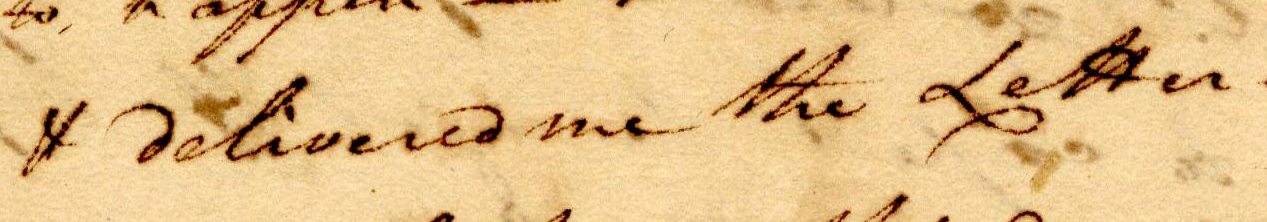& delivered me the Letter.
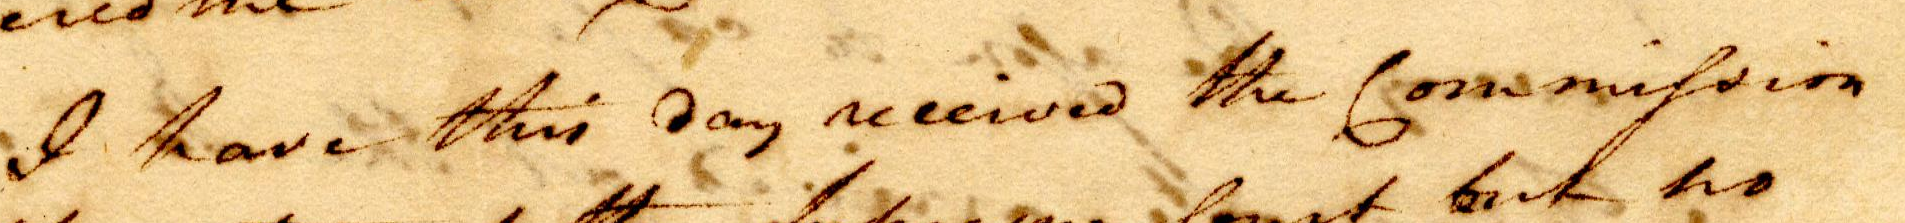I have this day received the Commission
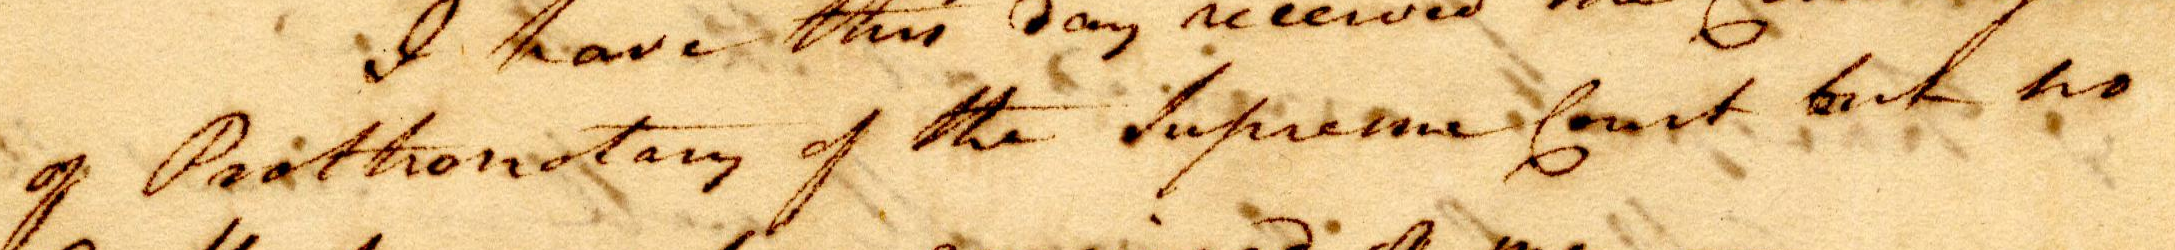of Prathonotary of the Supreme Court but no
